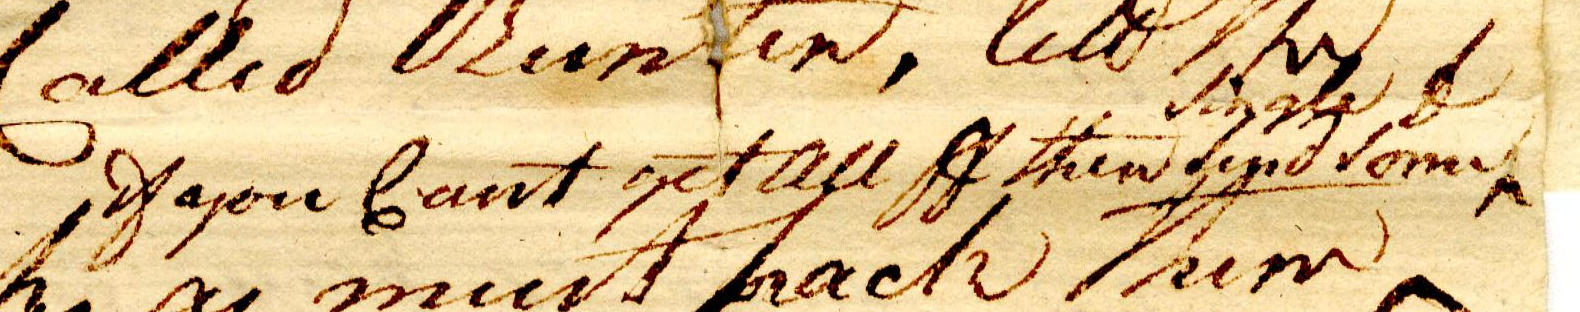if you Cant get all & then send Some ^
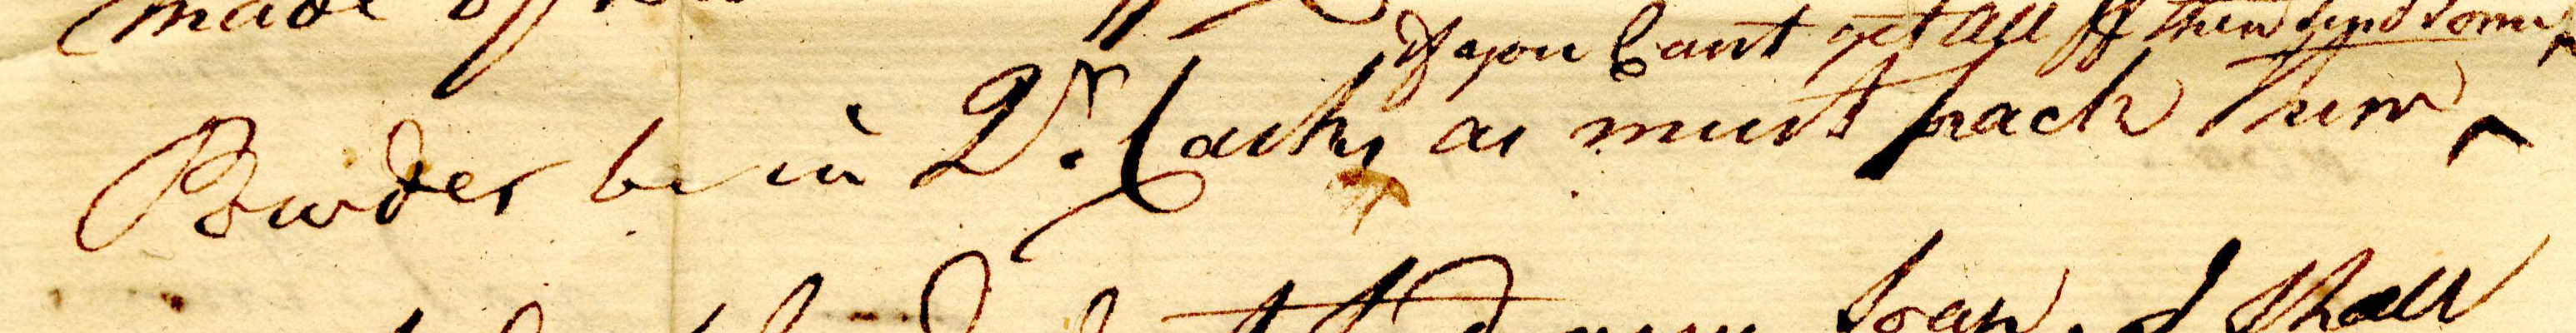Powder be in Q^r. Couch as must pack them &
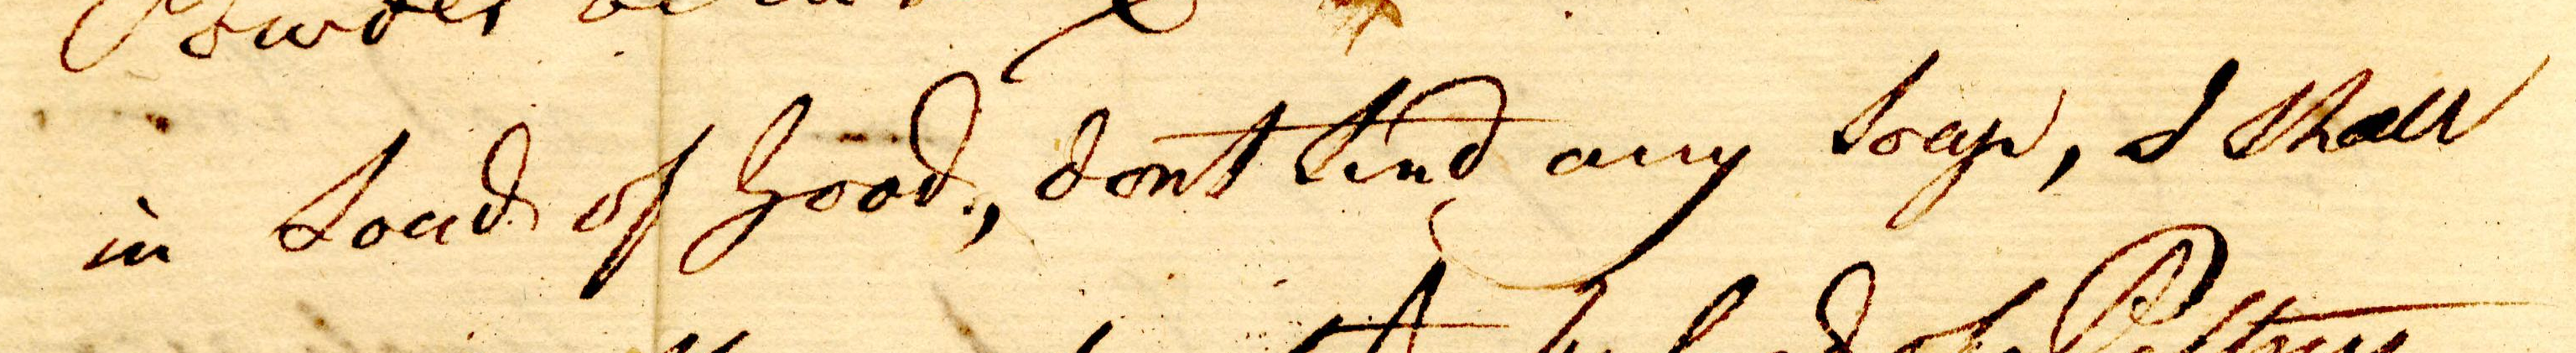in Load of Good, dont send any Soap, I shall
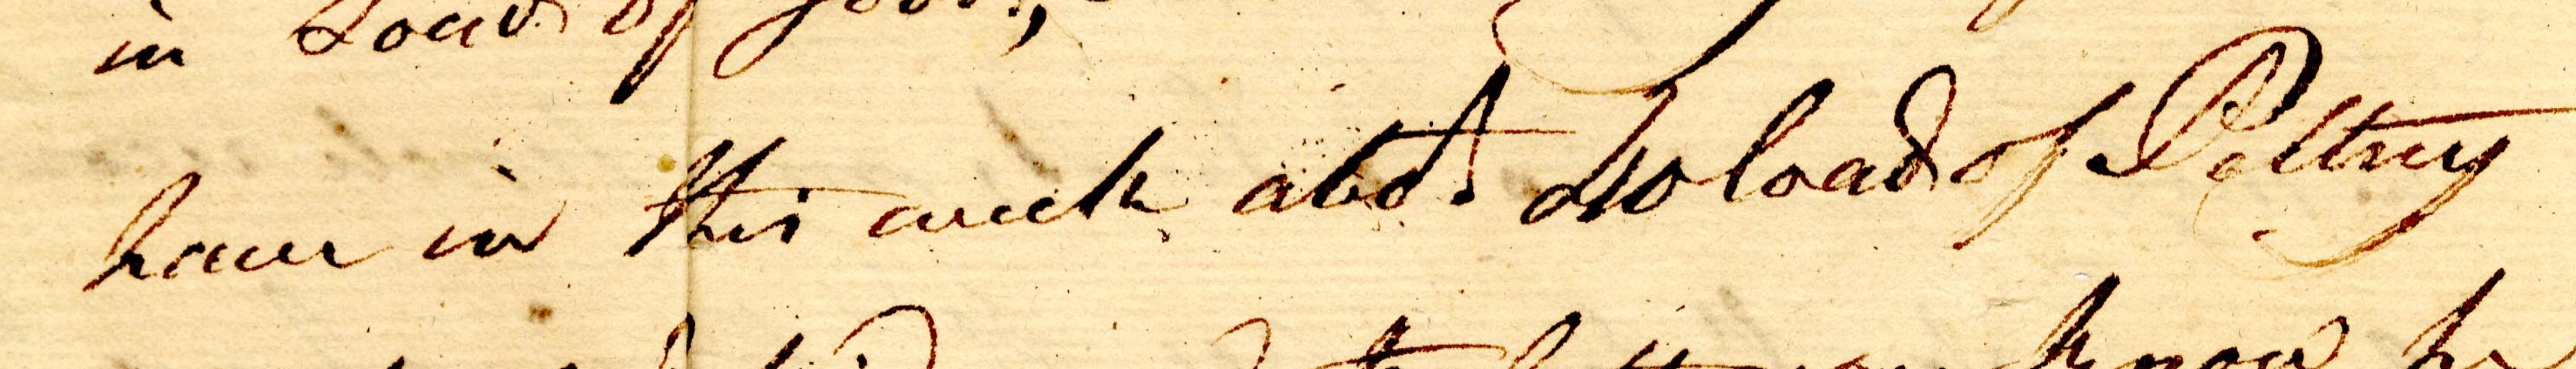have in this week abo^t. 40 load of Pottery
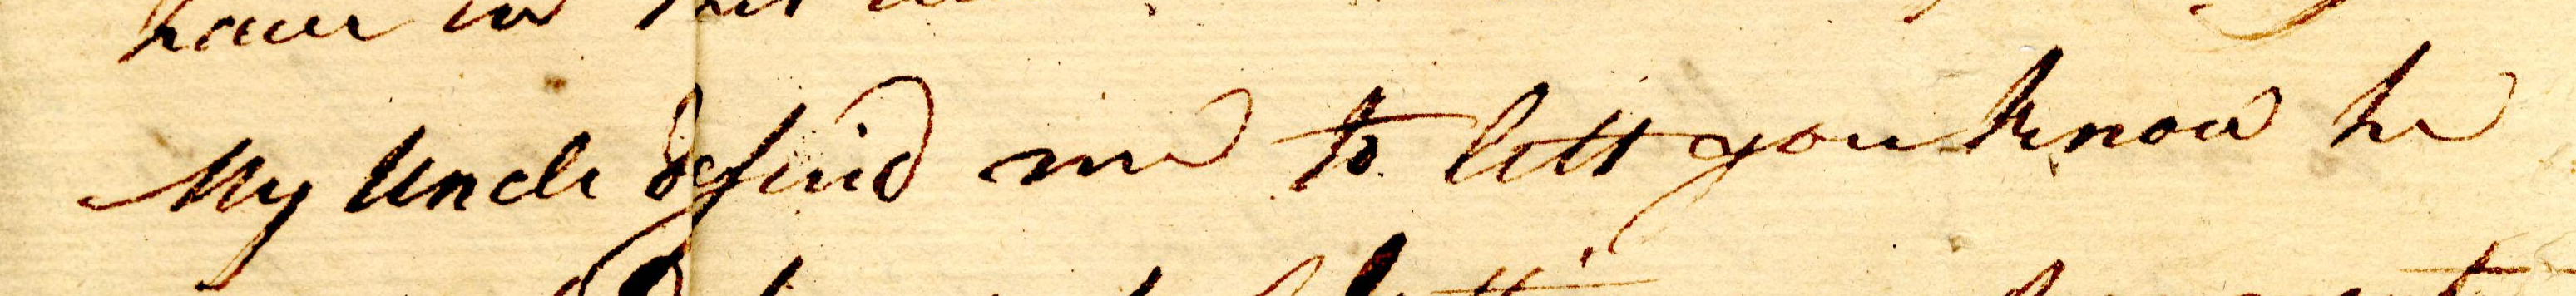My uncle desired me to lett you know he
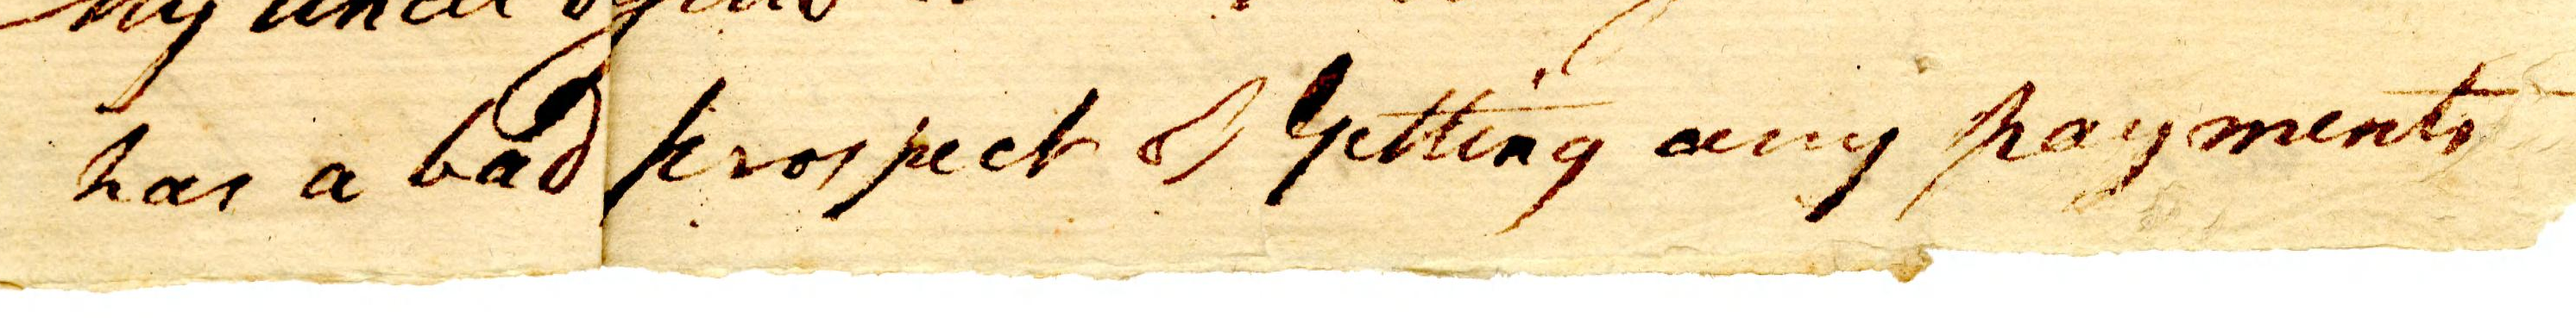has a bad prospect of getting any payments
